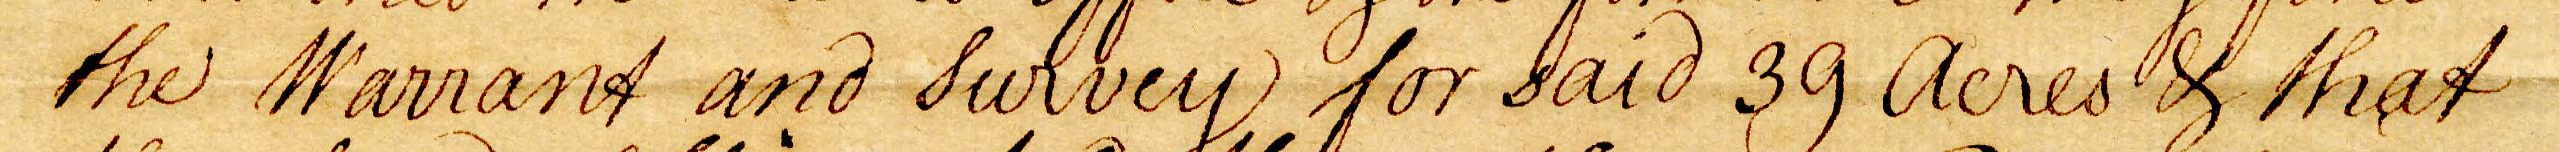the Warrant and Survey for said 39 Acres & that
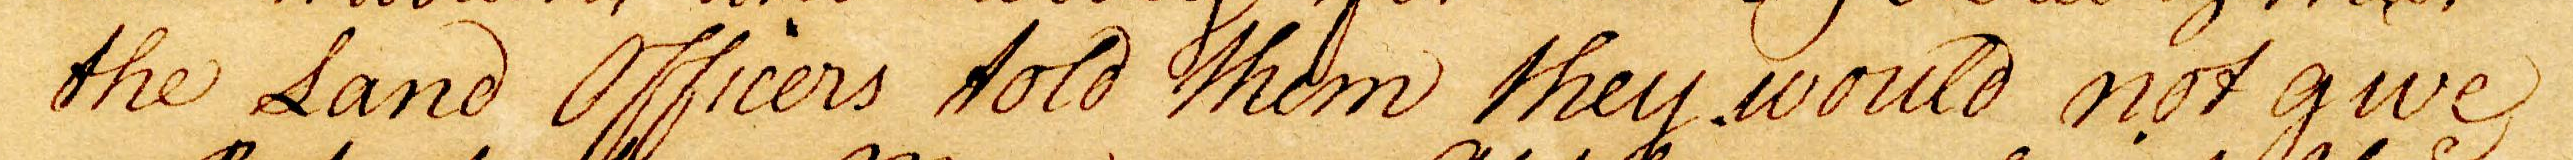the Land Officers told them they would not give
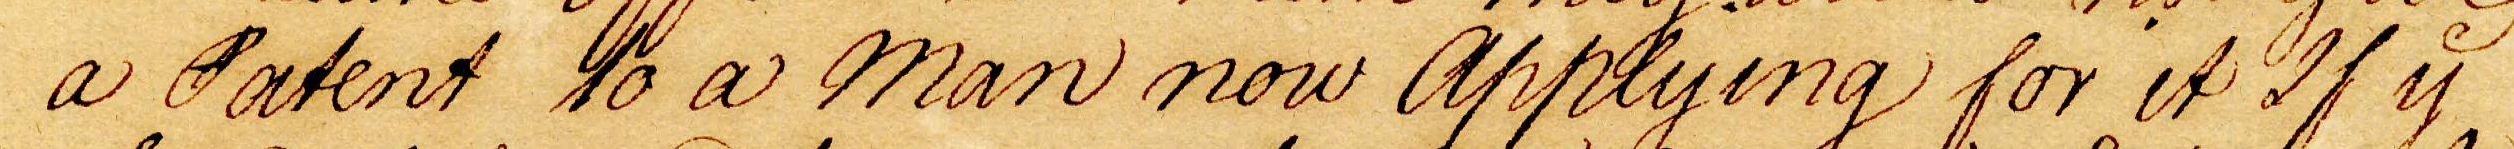a Patent to a Man now Applying for it If y^e
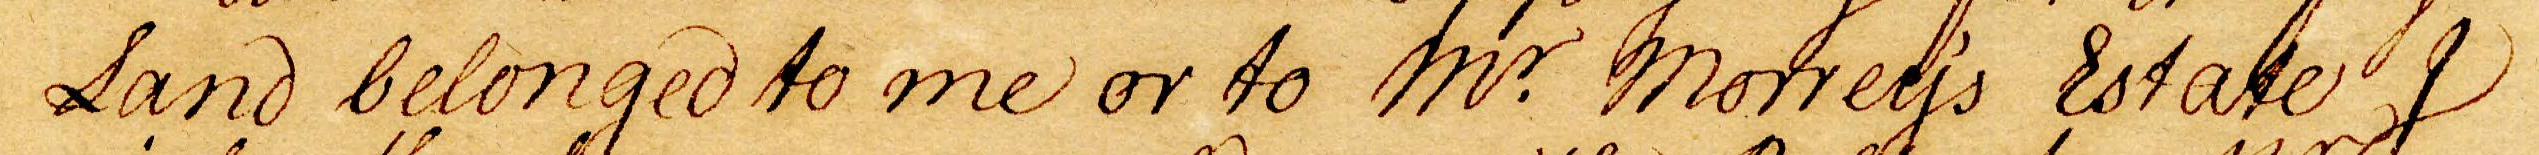Land belonged to me or to M^r. Morrey's Estate I
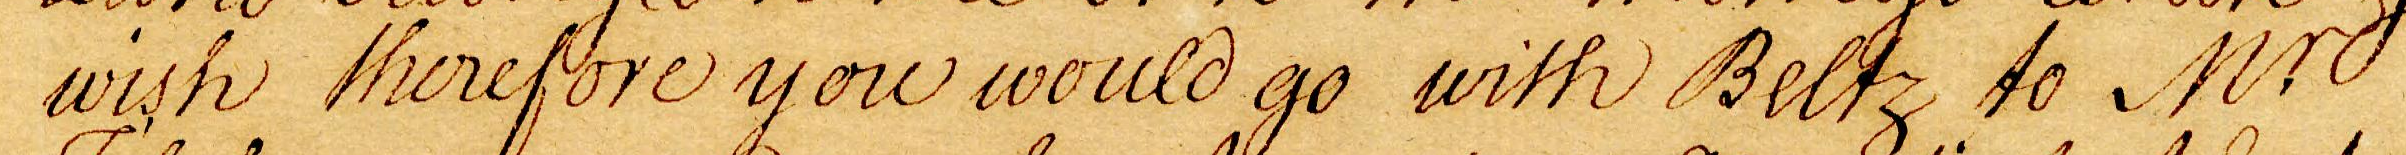wish therefore you would go with Beltz to M^r.
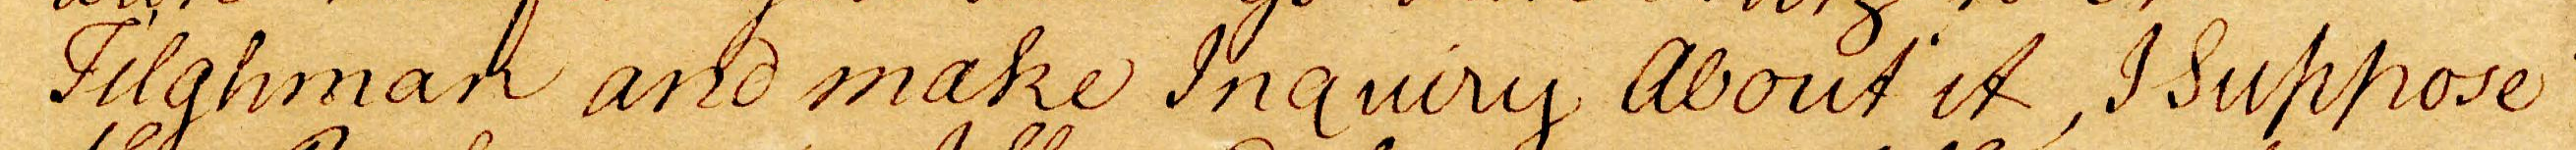Tilghman and make Inquiry About it, I suppose
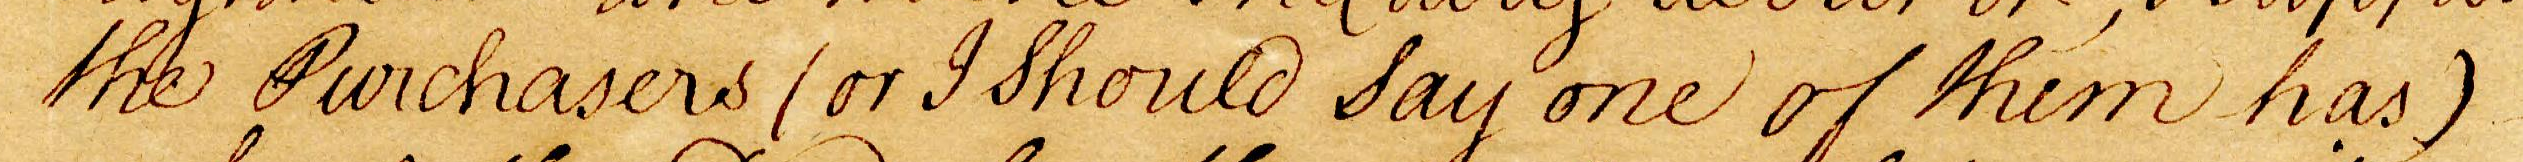the Purchasers (or I should say one of them has)
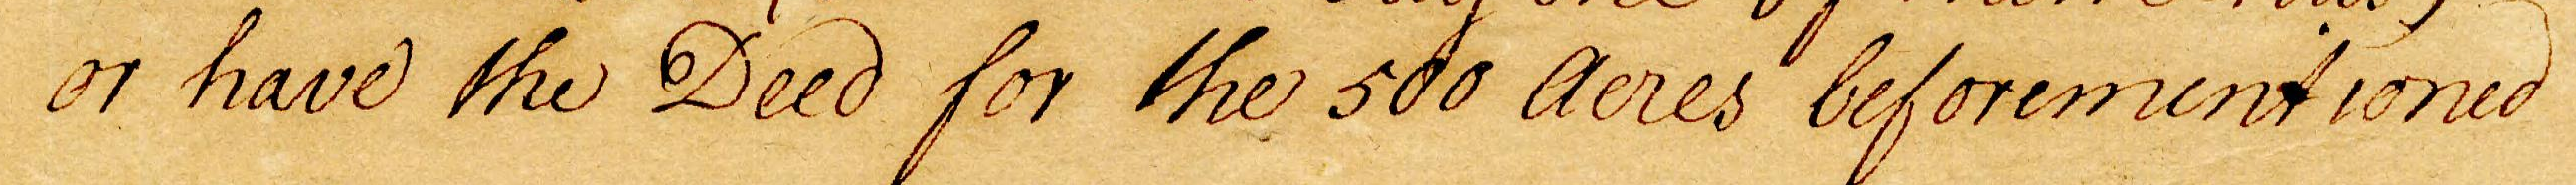or have the Deed for the 500 acres beforementioned
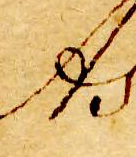As
